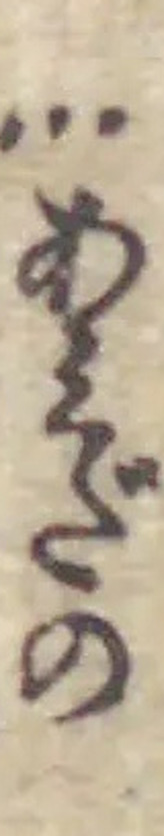あみだの
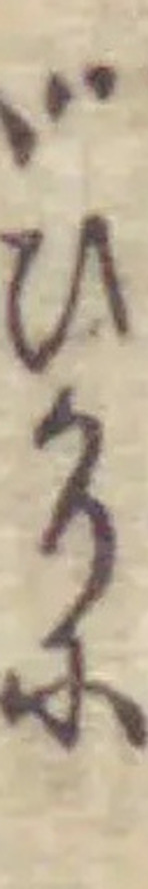ひかりに
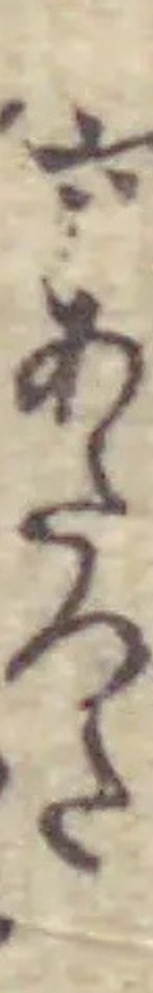あたつた
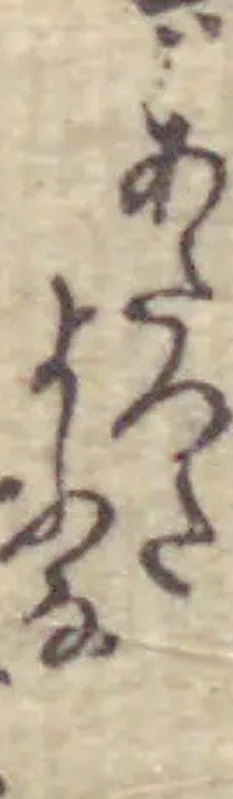よふな
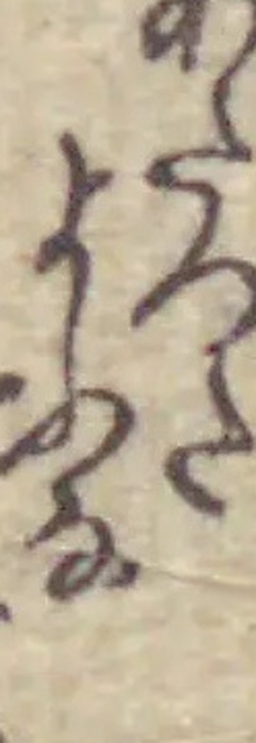よふな
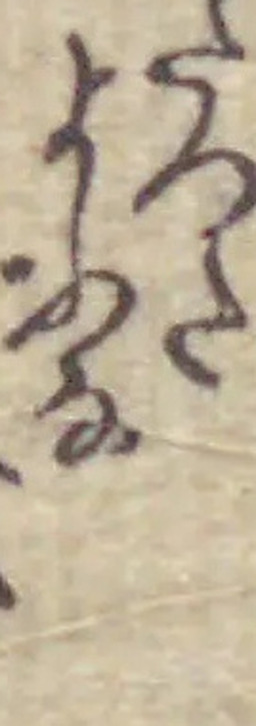よふな
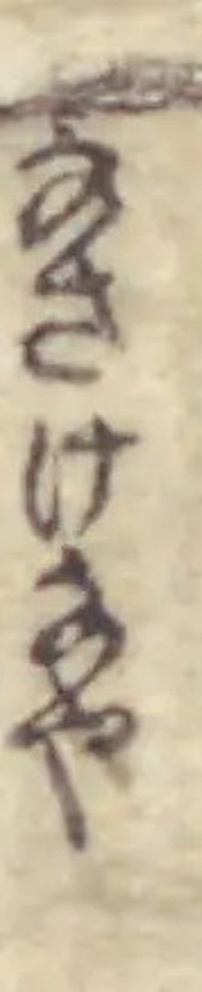なさけなや
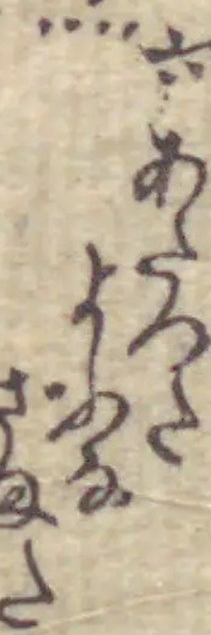あたつた
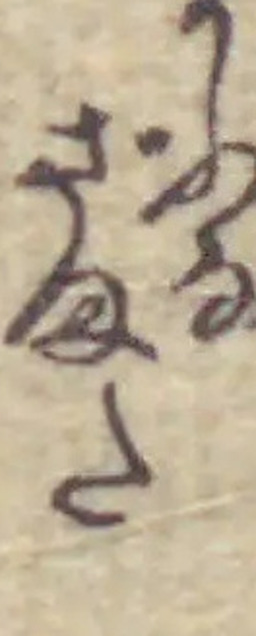ざまた
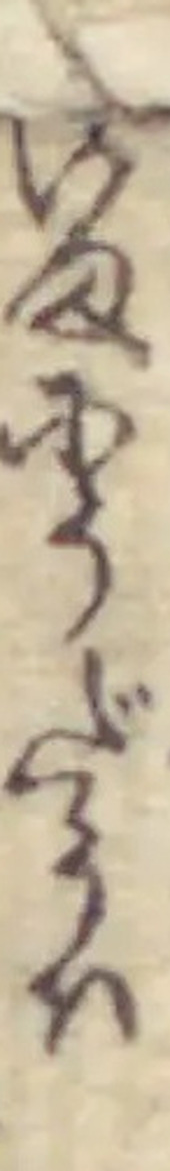いまにうだうは
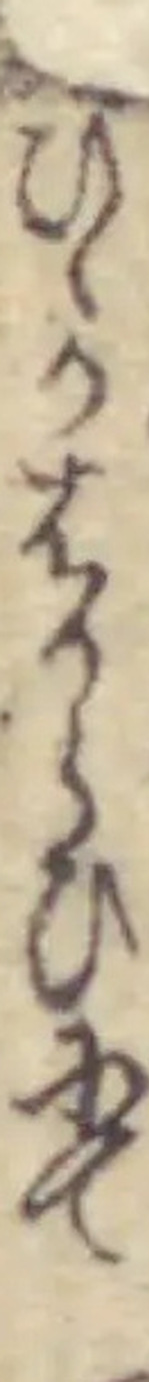ひゝかはからひにて
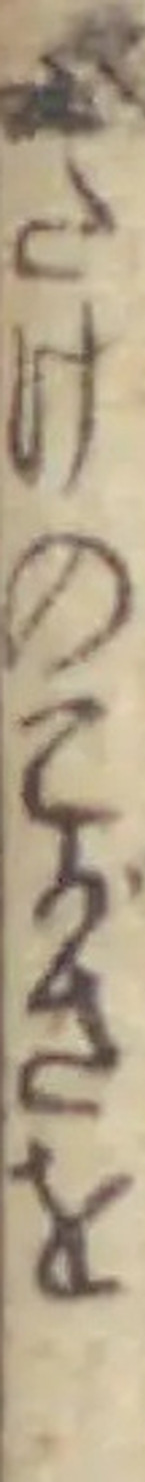たけのこがさを
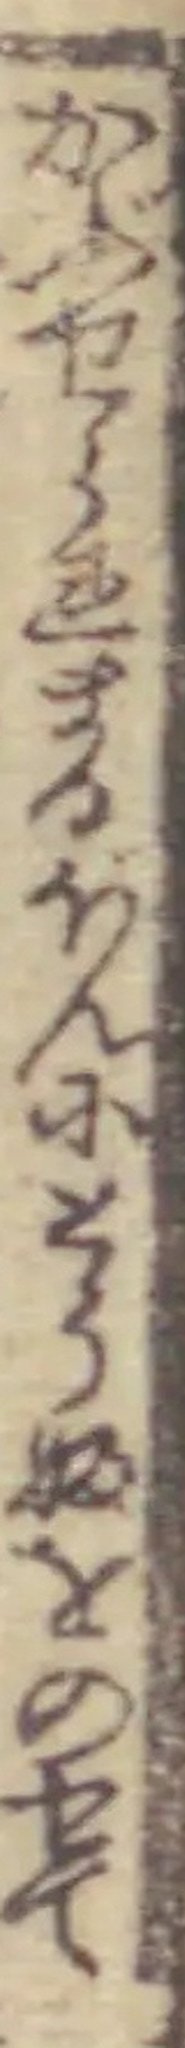かぶせられまるぼんにとうふをのせて
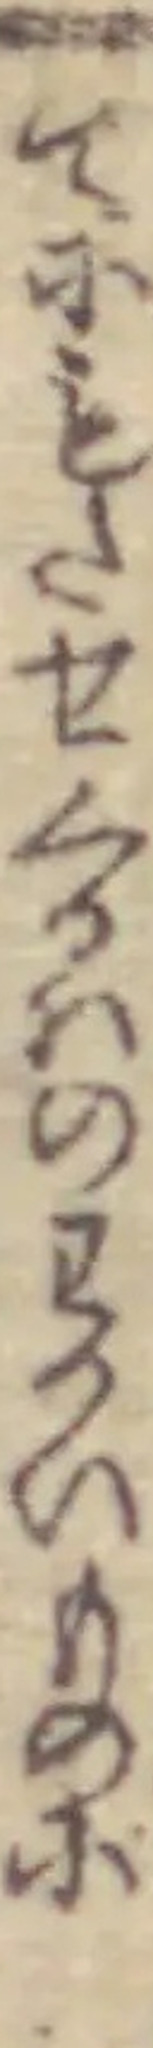てにもたせくるはのわかいものに
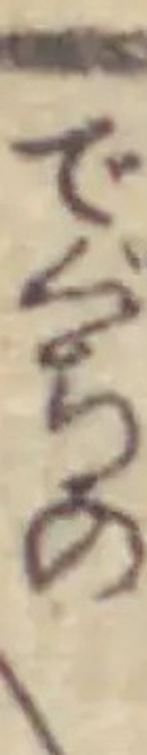でぐちの
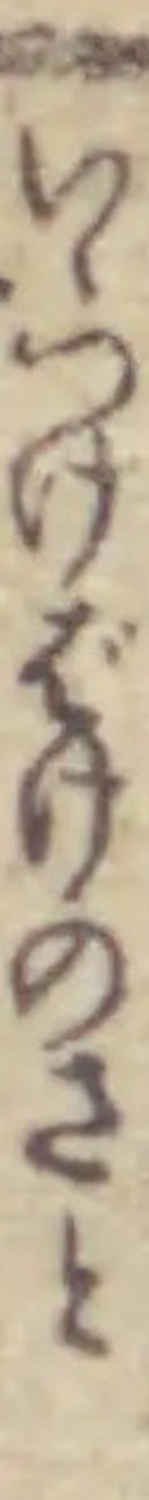いゝつけばけのさと
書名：大昔化物双紙 2巻
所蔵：国立国会図書館 National Diet Library, JAPAN
